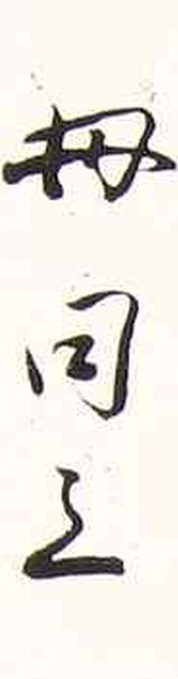母同上
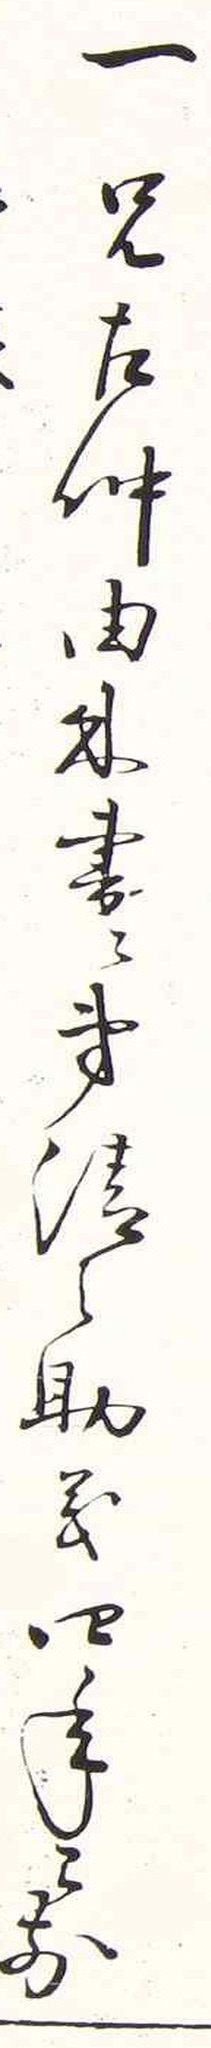一兄古仲由来書ニ弟清之助義四年已前
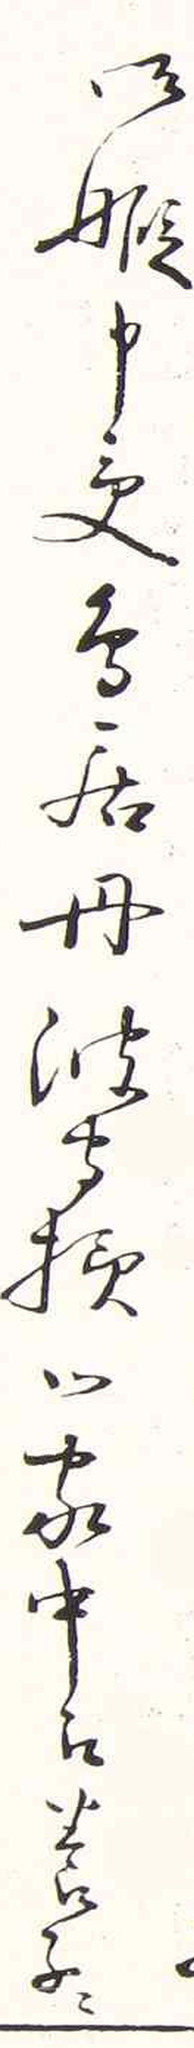御暇申受鳥居丹波守様御家中江養子ニ

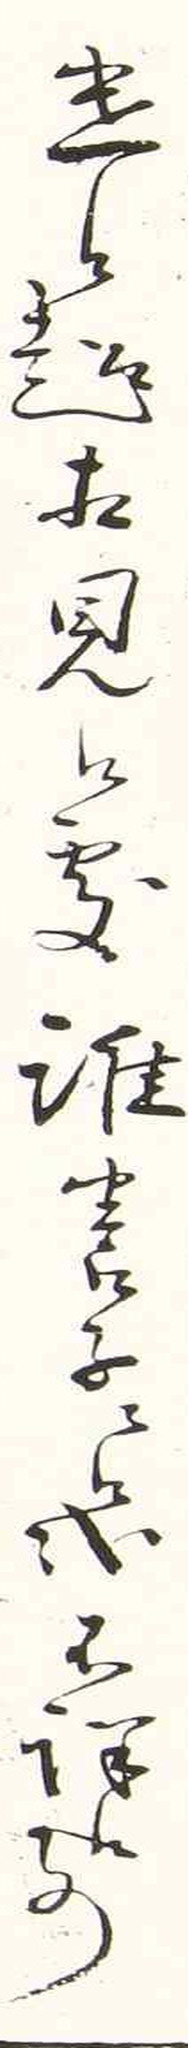遣候趣相見候処誰養子ニ候哉不詳候事
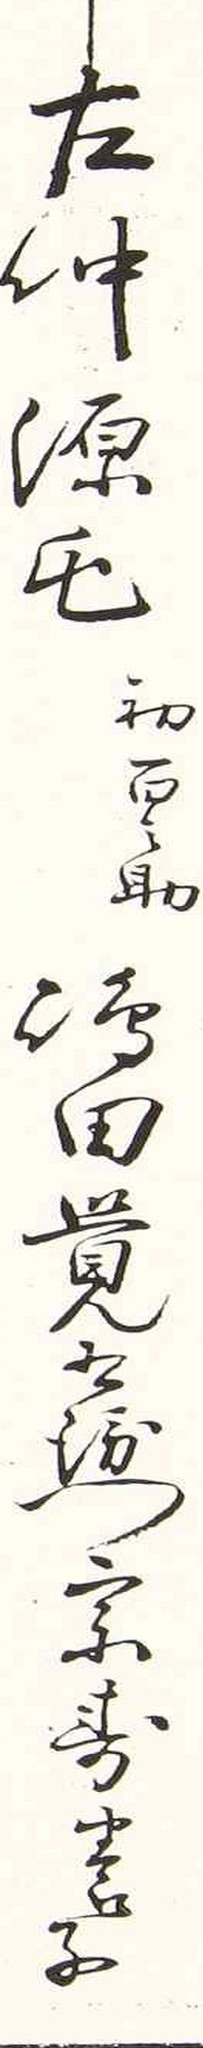古仲源屯初百之助島田覚右衛門宗寿養子
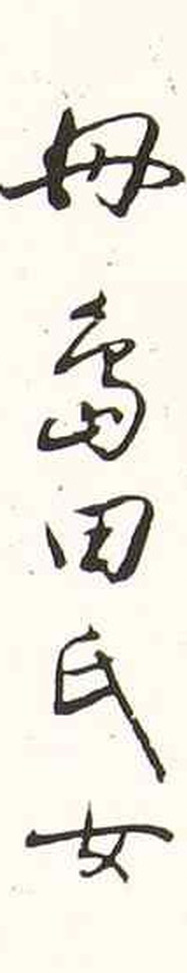母島田氏女
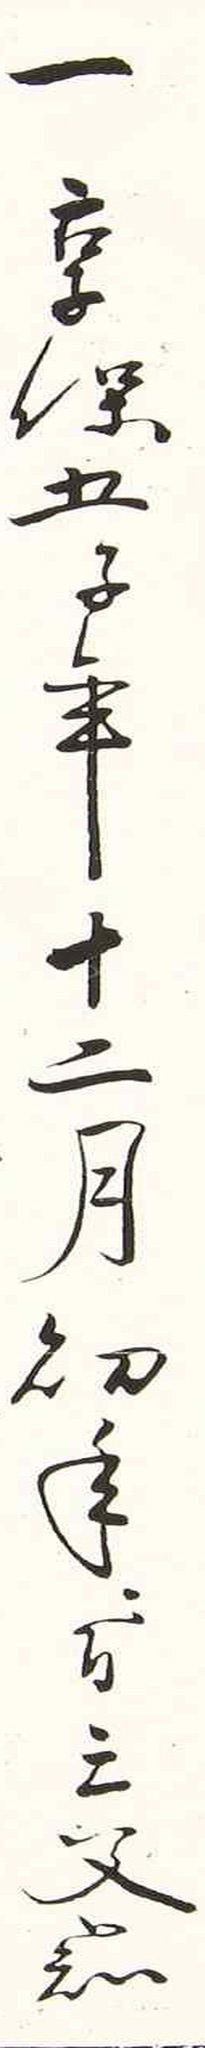一享保五子年十二月幼年ニ付亡父御知
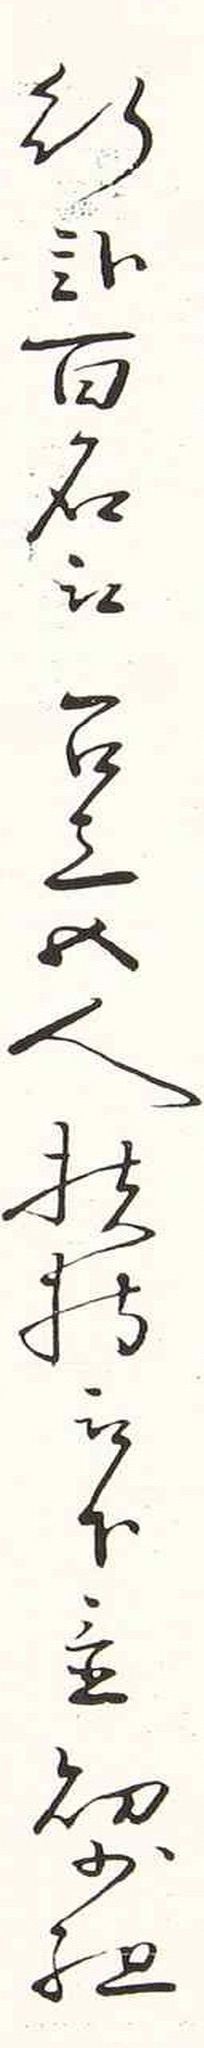行弐百石被召上五人扶持被下置幼少組
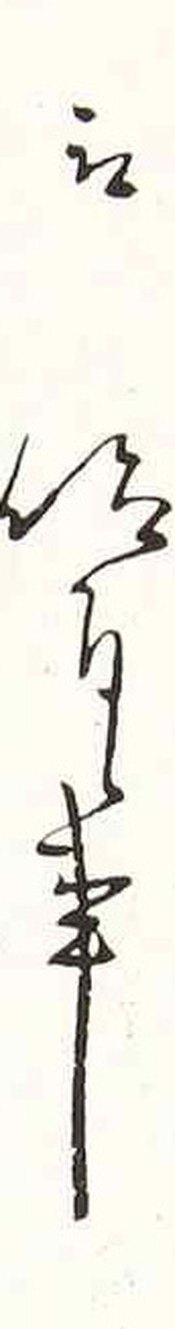被仰付候事
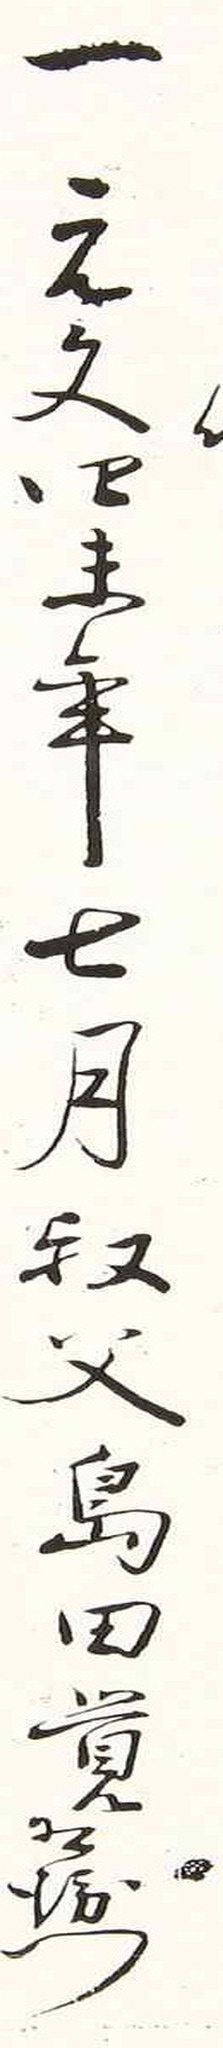一元文四未年七月叔父島田覚右衛門
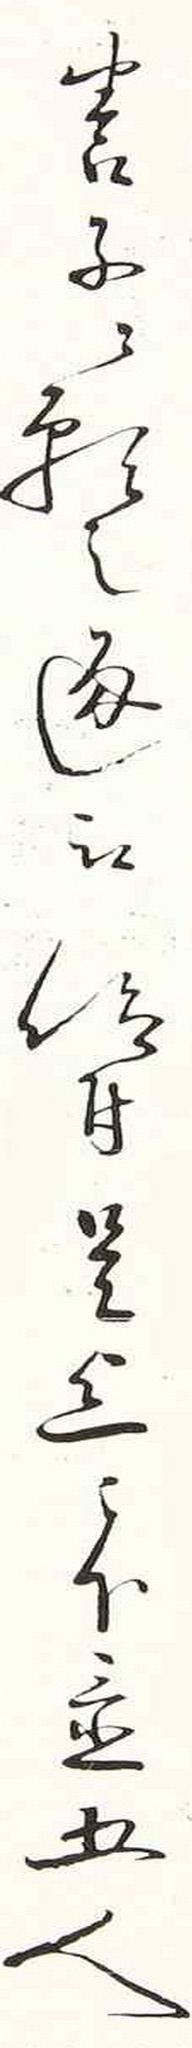養子ニ願之通被仰付是迄被下置五人
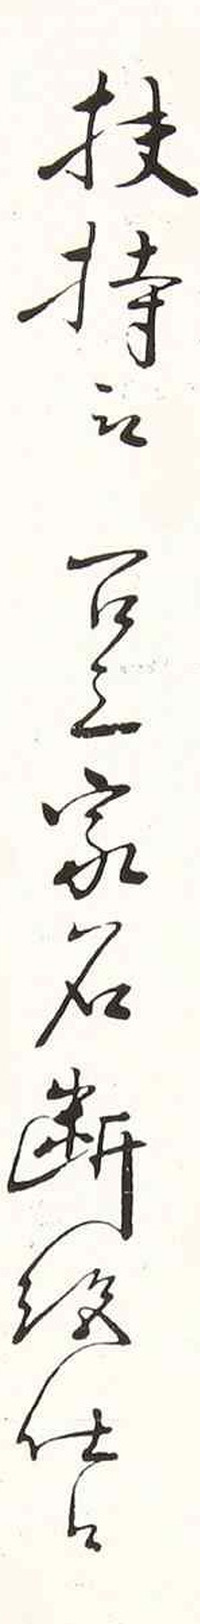扶持被召上家名断絶仕候
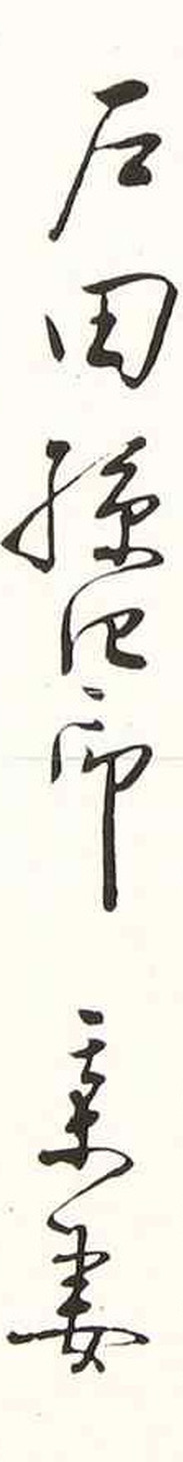女戸田孫四郎某妻
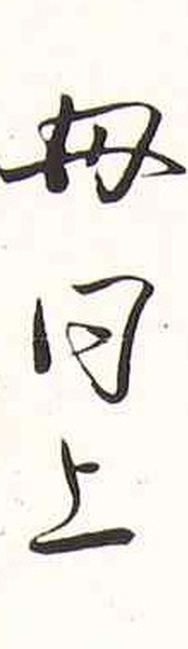母同上
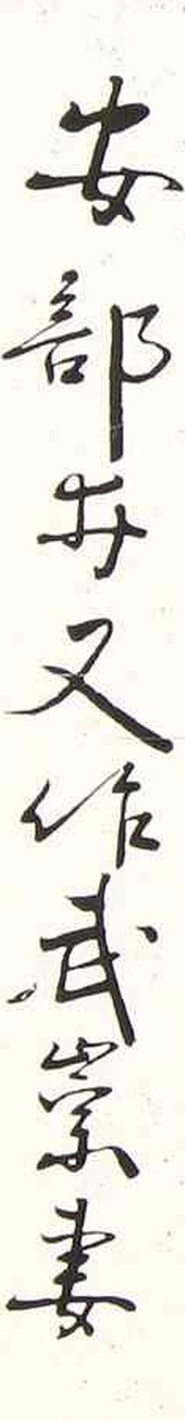女安部井又作武崇妻
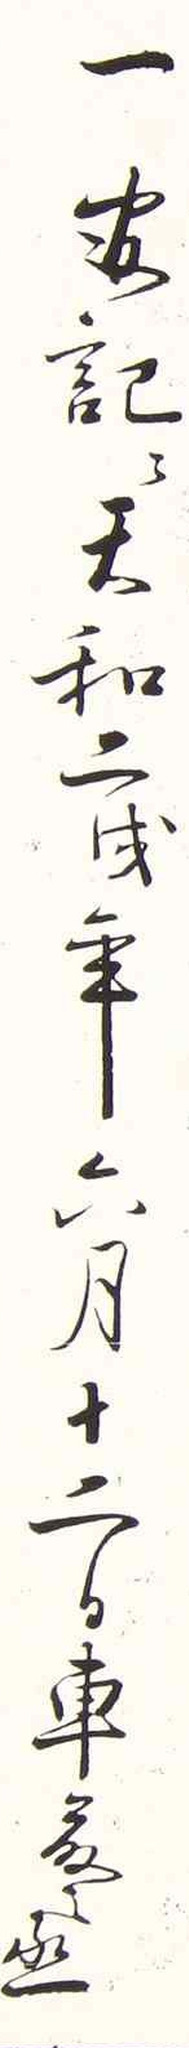一官記ニ天和二戌年六月十二日車藤之丞
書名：諸士系譜　巻之357　す之部7
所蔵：会津若松市立会津図書館
